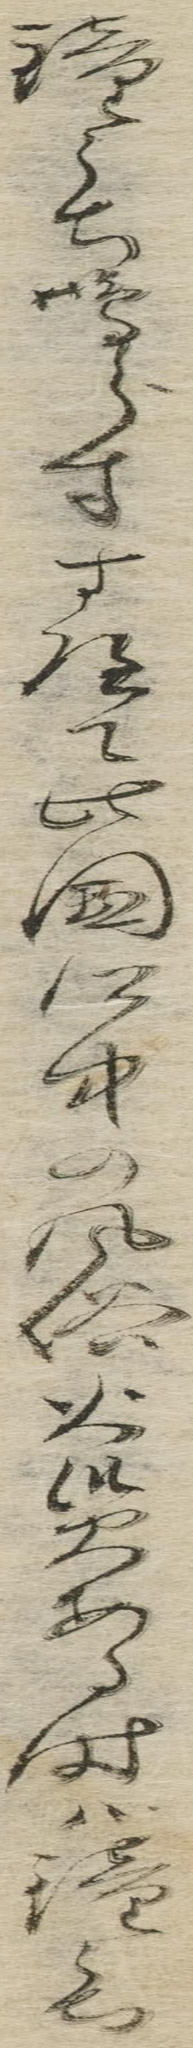鐘たゝち鳴らすすへて此国郷中の風俗火災ある時ハ鐘たゝち
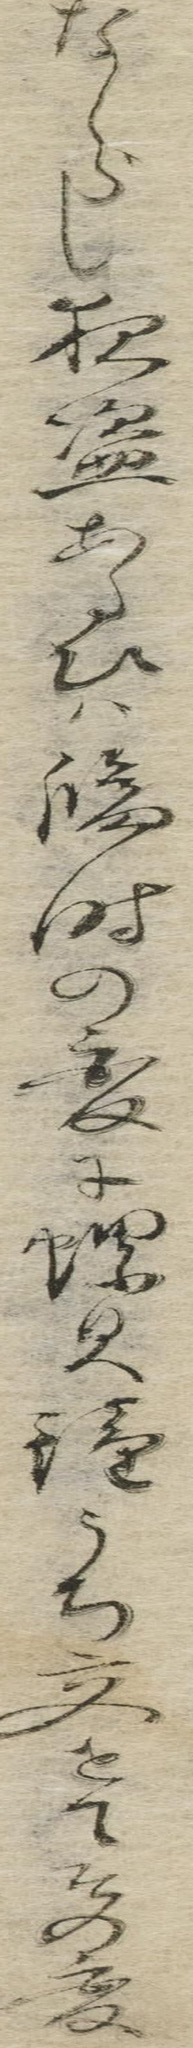ならし盗賊あるひハ臨時の変に螺貝鐘うち交をてその変
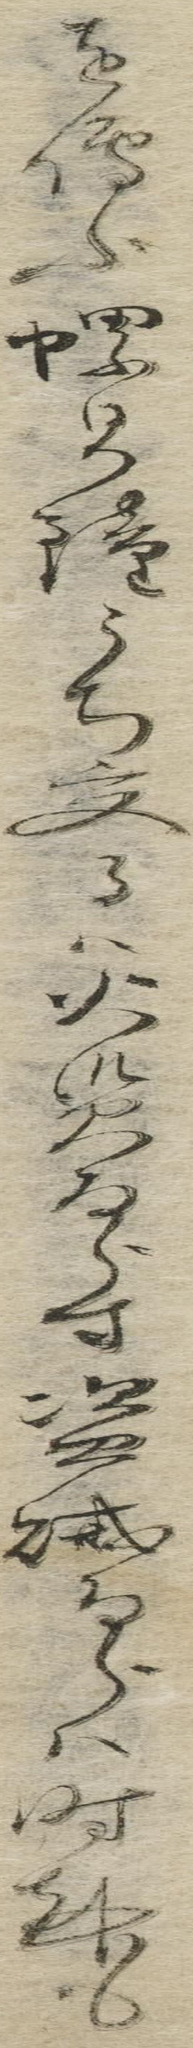を伝ふ螺貝鐘うち交るハ火災ならす盗賊ならハ時刻も

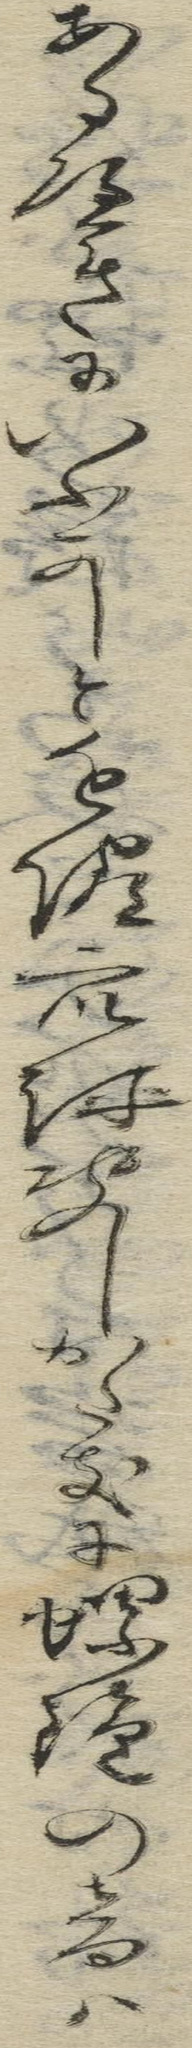あるへきにいふ可と近隣衆評決しかたしに螺鐘の音ハ
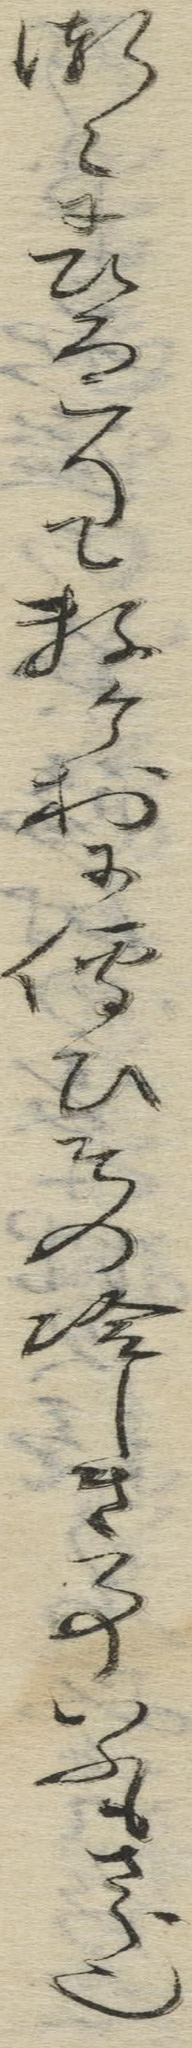漸にひろこりて数ヶ村に伝ひその冷しき事いふもさら也
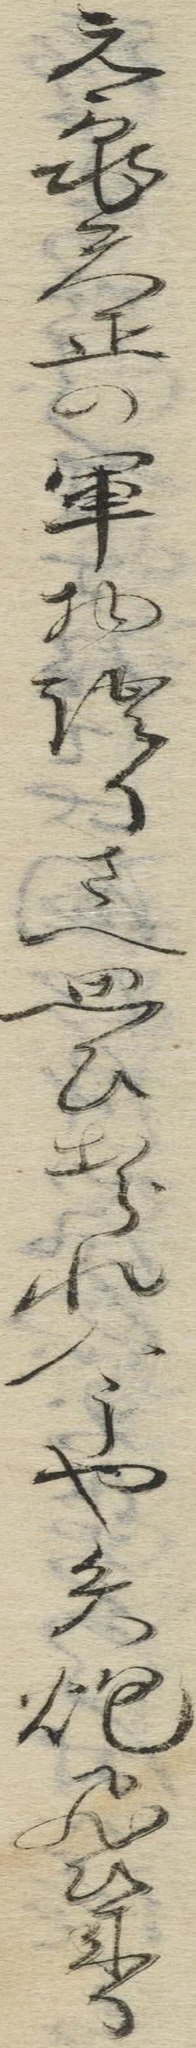元亀天正の軍物語りさへ思ひ出られ今や鉄炮飛ひ来り
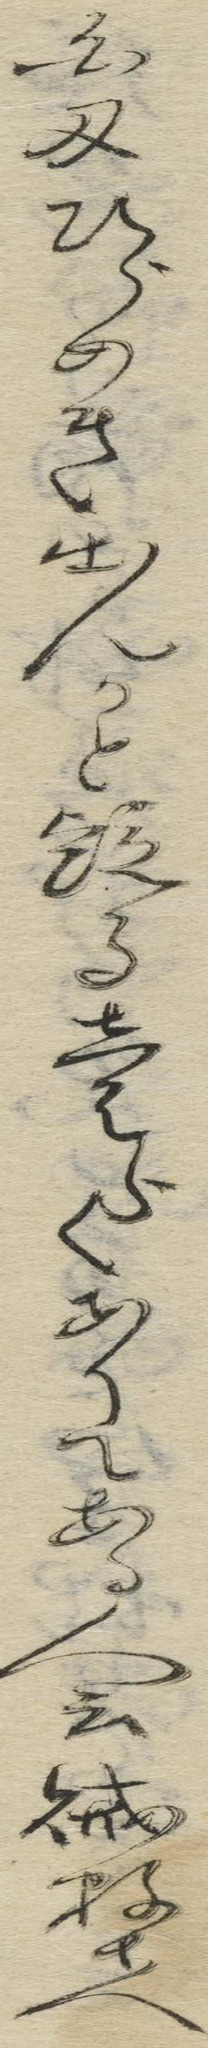円刃ひらめき出んかと歎るしはらくありてある人云賊数十人
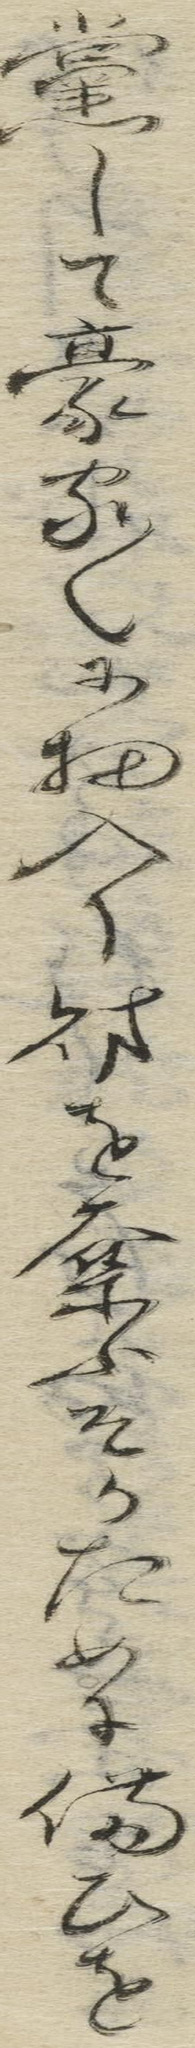党して豪家〳〵に押入り財を奪ふそかために備ひを
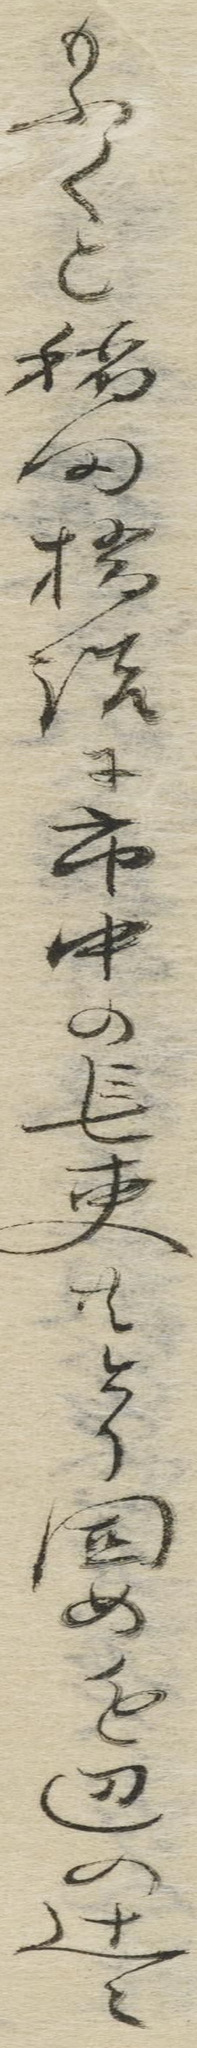もふくと稲田橋詰に市中の長吏共とり囲め近辺の辻々
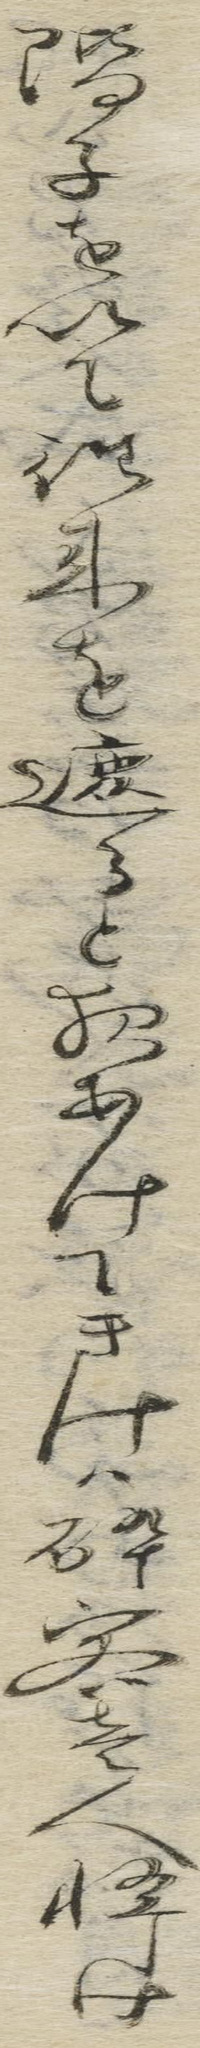階子を以て往来を遮ると夜明けてきけハ酔客壱人怪しけ
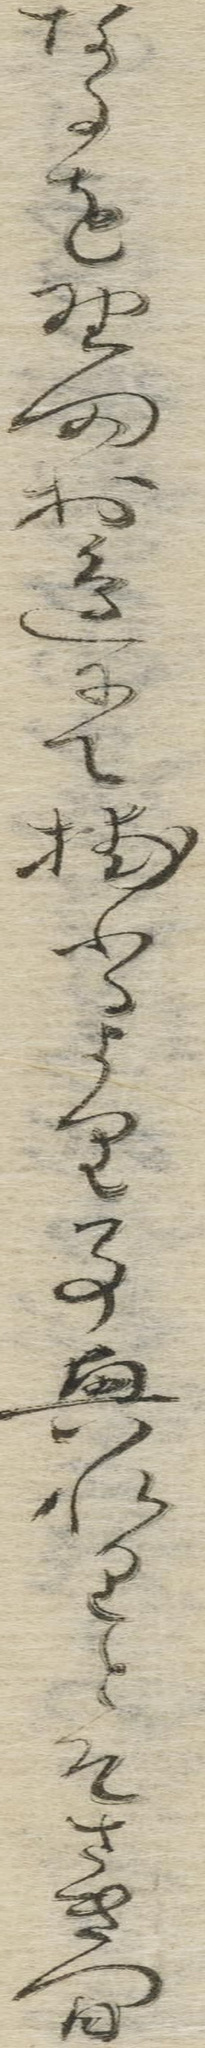なるを野田村辺にて捕ふるより事興けりとそさきつ日
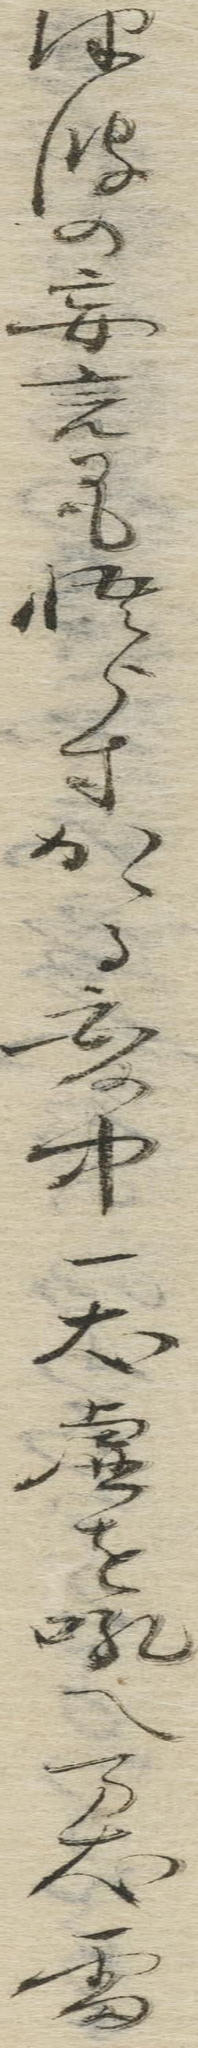津波の妄言にも悟らすかゝる変中一丈慮を吼へ万丈雷
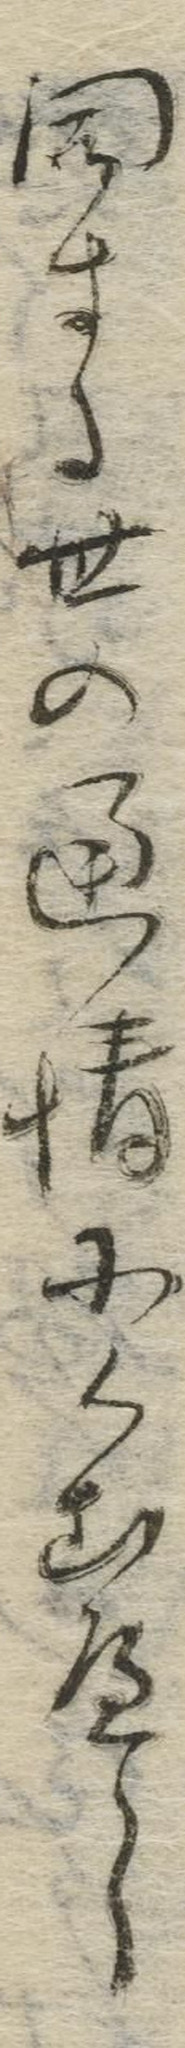同する世の通情にくむへし
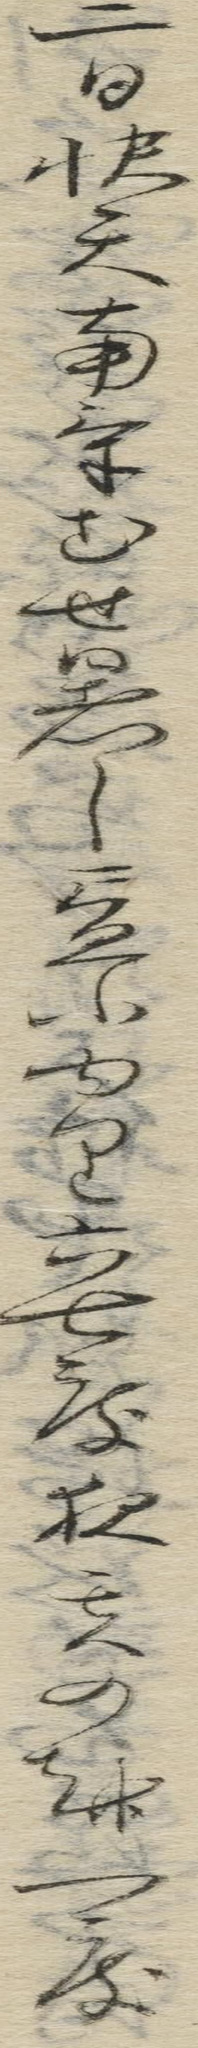二日快天南気むせ暑し昼小ゆり六七度夜亥の刻一度
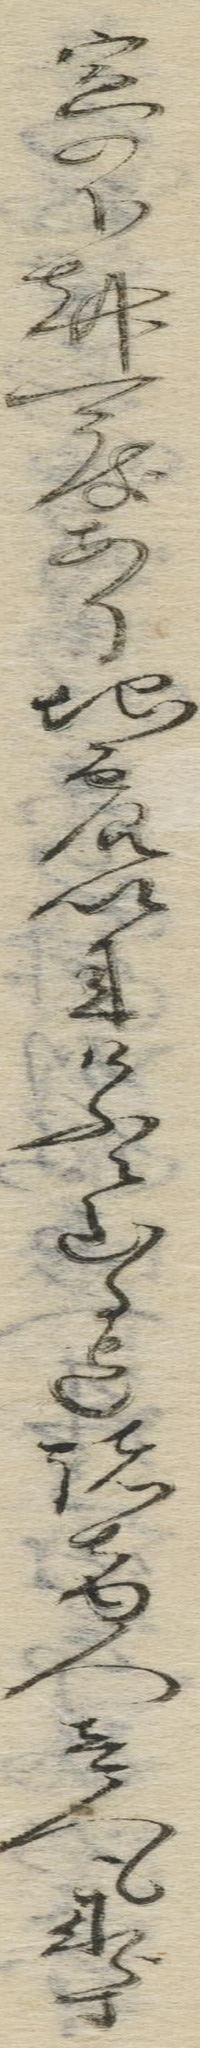寅の下刻一度あり地震以来けふに至る迄諸商人壱人も来らす
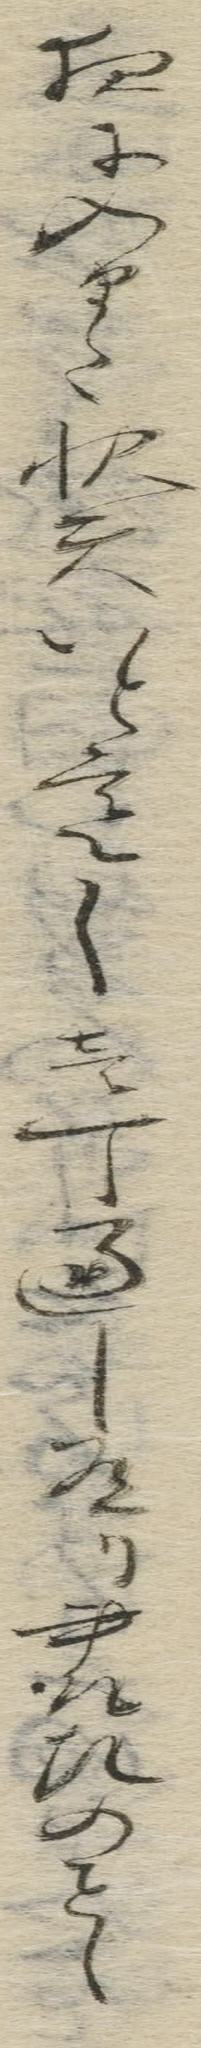夜に入また快天いと寒し壱丁通し有り事記左のことし
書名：弘化丁未天變日記
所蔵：東京大学地震研究所図書室 Earthquake Research Institute Library, The University of Tokyo, JAPAN
